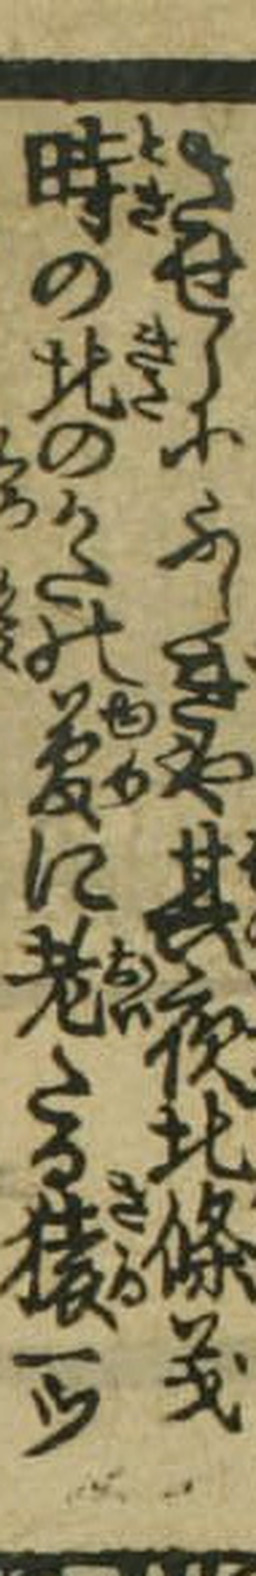時の北のかたの夢に老たる猿一ツ
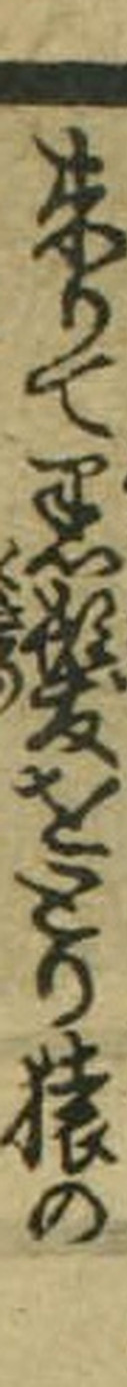来りて黒髪をとり猿の
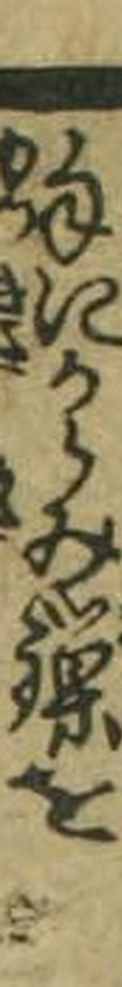手にからみ鏁を
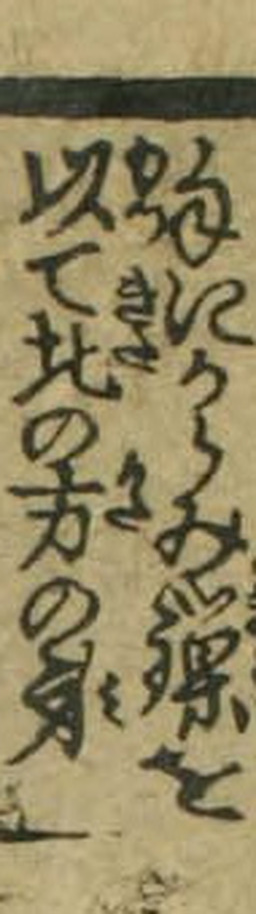以て北の方の身
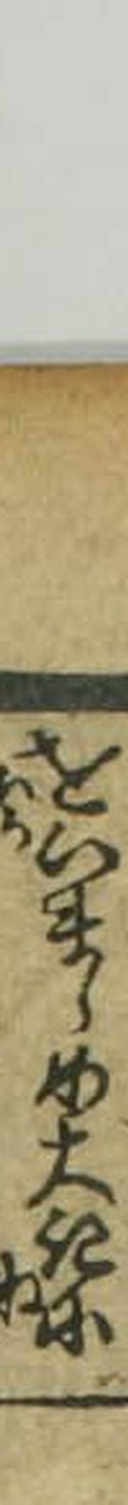をいましめ大きに
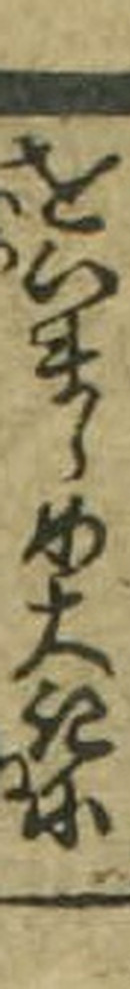をいましめ大きに
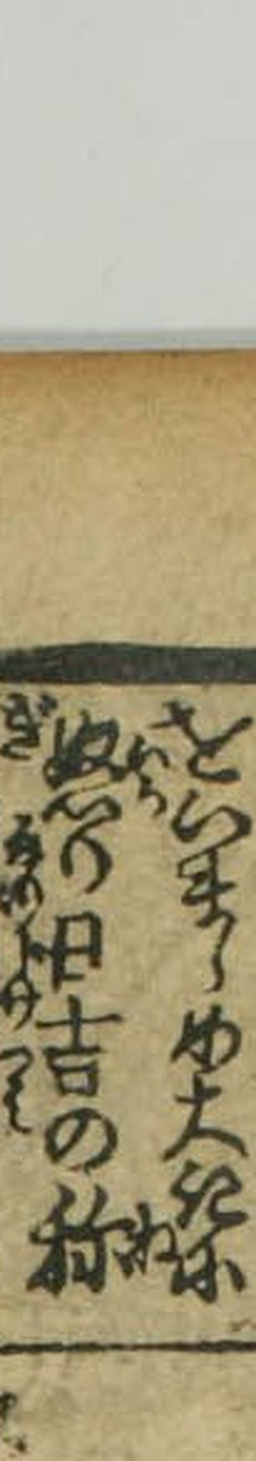怒り日吉の祢
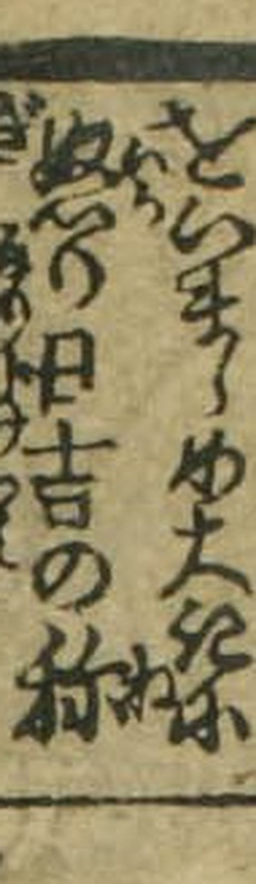怒り日吉の祢
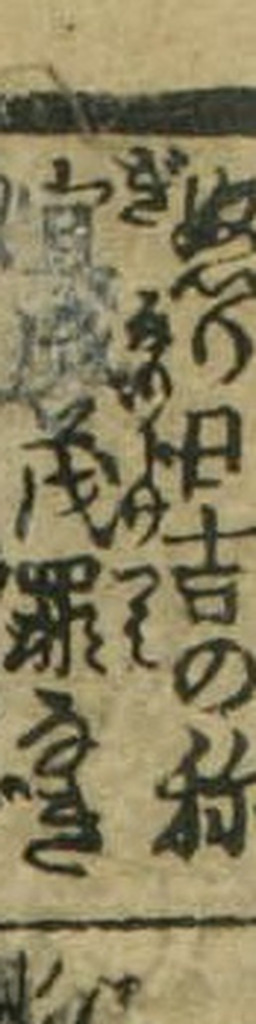宜成茂罪なき
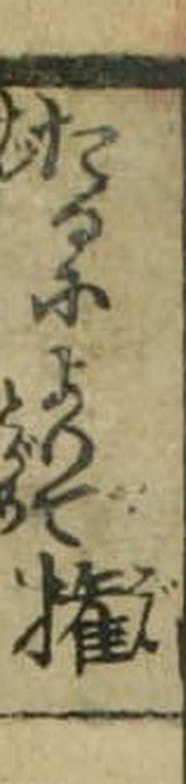たるによりて権
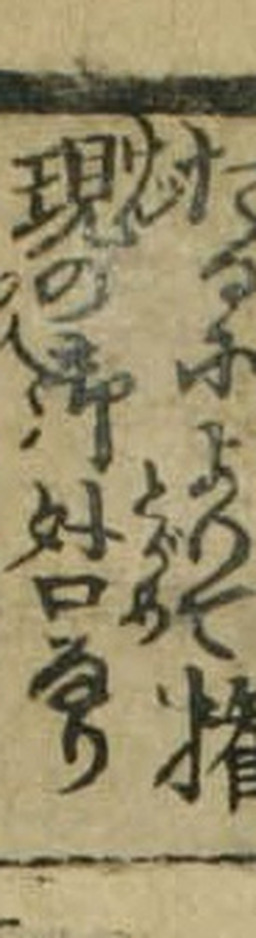現の御咎なり
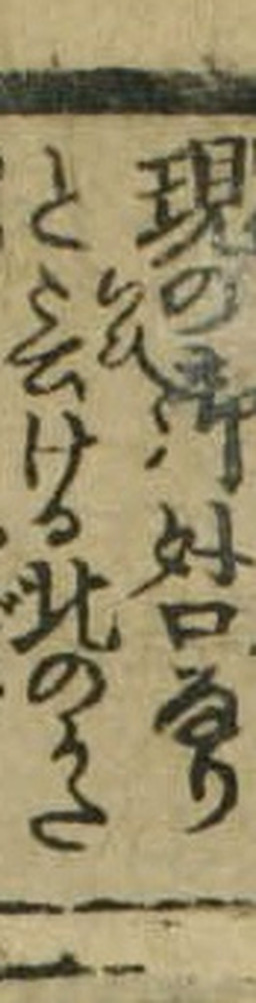と言ける北のかた
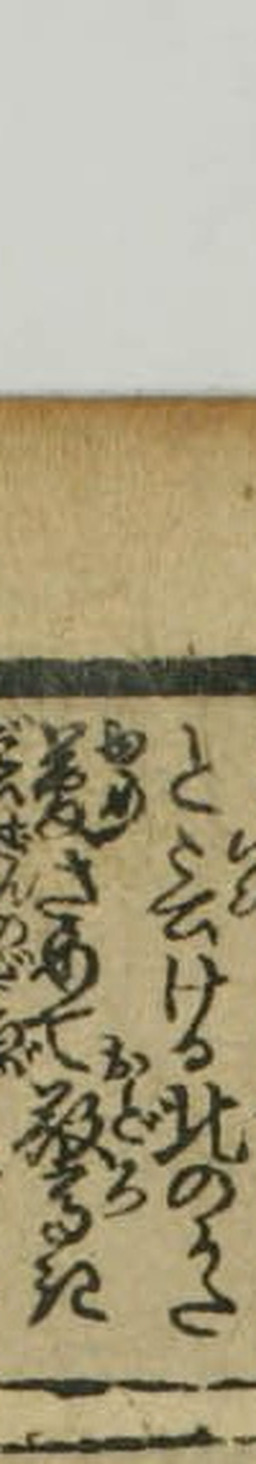夢さめて驚き
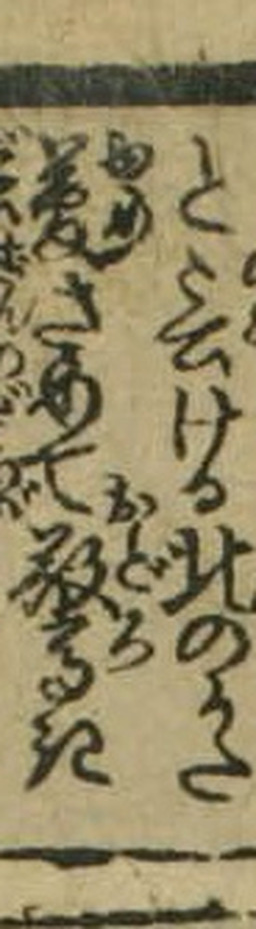夢さめて驚き
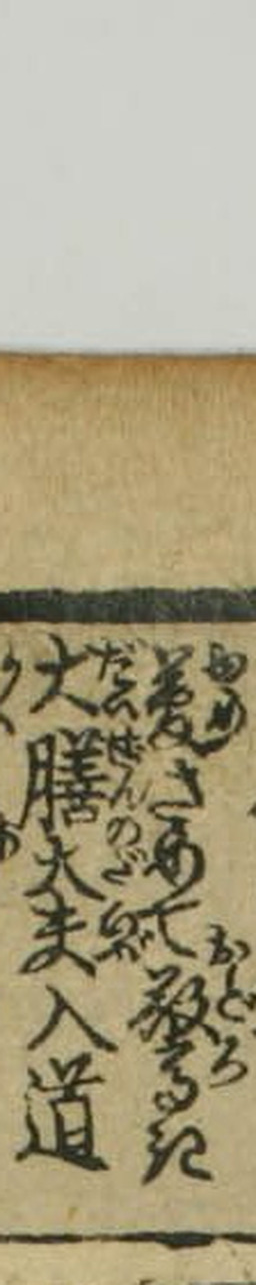大膳大夫入道
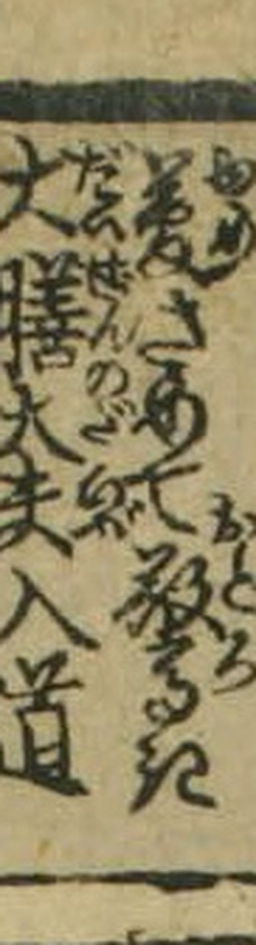大膳大夫入道
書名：續英雄百人一首
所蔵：東京学芸大学附属図書館
